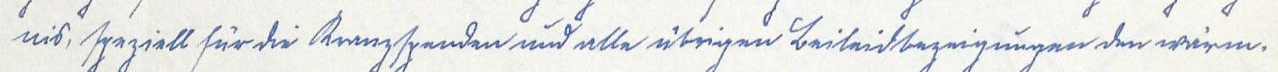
nis speziell für die Kranzspenden und alle übrigen Beleidsbezeugungen den wärm-
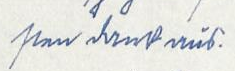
sten Dank aus.
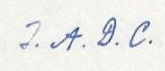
I. A. D. C.
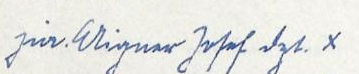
iur. Aigner Josef dzt. X
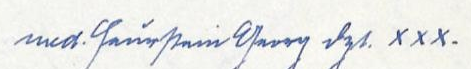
med Feurstein Georg dzt. XXX
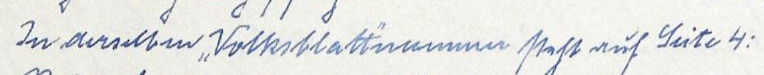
In derselben „Volksblattnummer“ steht auf Seite 4:
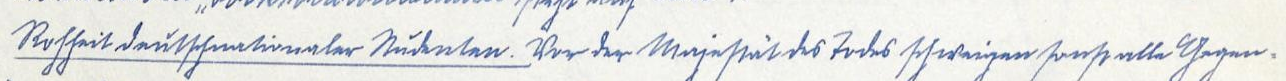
Rohheit deutschnationaler Studenten: Vor der Majestät des Todes Schweigen sonst alle Gegen-
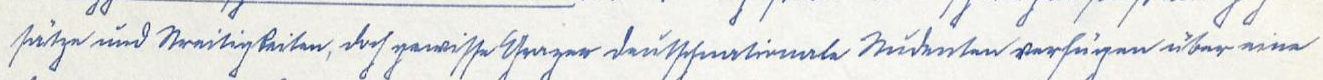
sätze und Streitigkeiten, doch gewisse Grazer deutschnationale Studenten verfügen über eine
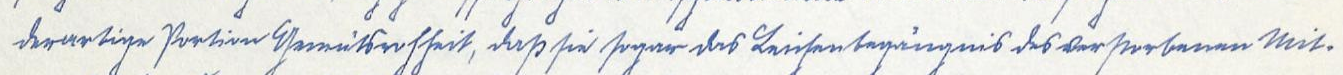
derartige Portion Gemütsrohheit, daß sie sogar das Leichenbegägnis des verstorbenen Mit-
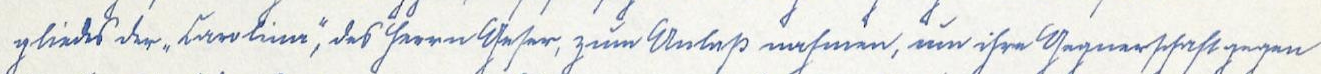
glieds der „Carolina“, des Herrn Geser, zum Anlaß nahmen, um ihre Gegnerschaft gegen
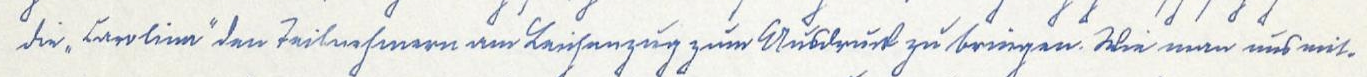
die „Carolina“ den Teilnehmern am Leichenzug zum Ausdruck zu bringen. Wie man uns mit-
